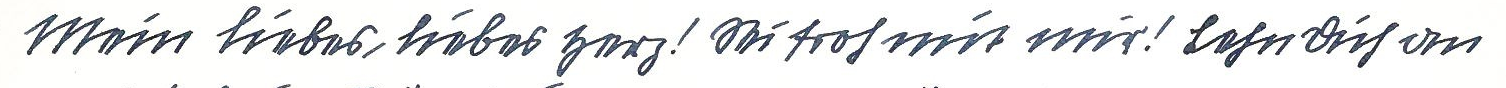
Mein liebes, liebes Herz! Sei froh mit mir! Lehn Dich an
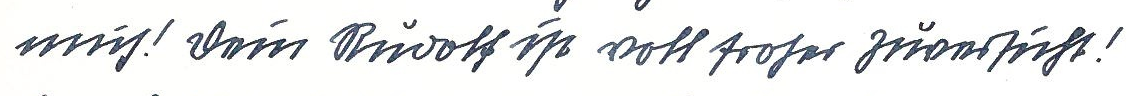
mich! Dein ist voll froher Zuversicht!
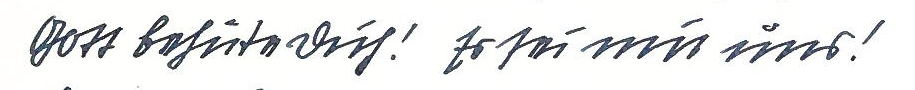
Gott behüte Dich! Er sei mit uns!
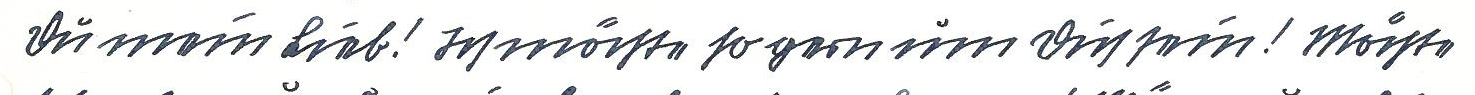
Du mein Lieb! Ich möchte so gern um Dich sein! Möchte
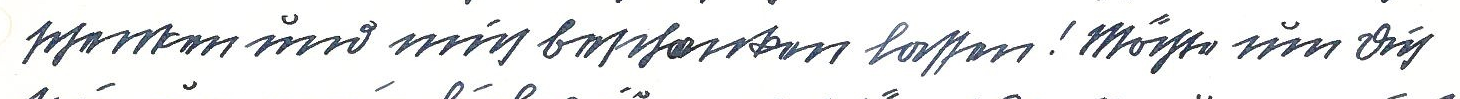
schenken und mich beschenken lassen! Möchte um Dich
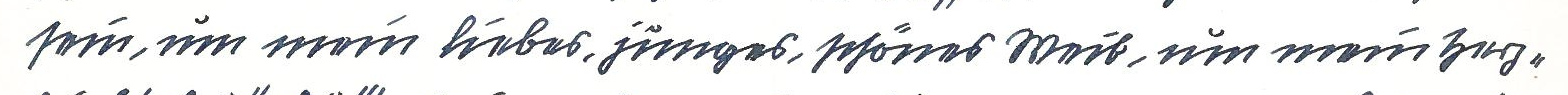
sein, um mein liebes, junges, schönes Weib, um mein Herz¬
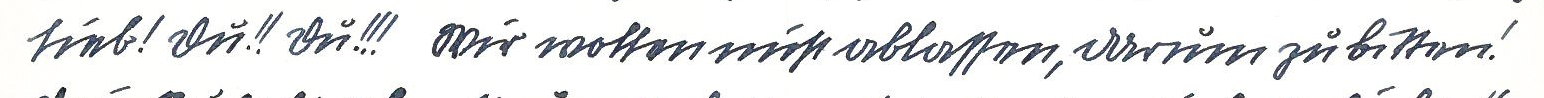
lieb! Du!! Du!!! Wir wollen nicht ablassen, darum zu bitten!
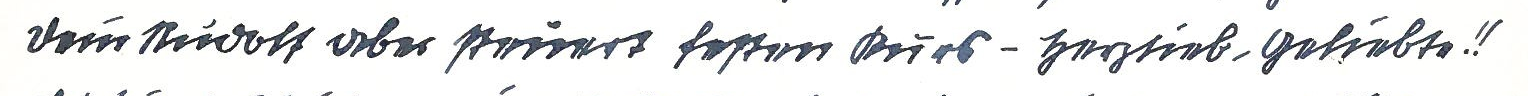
Dein aber steuert festen Kurs – Herzlieb, Geliebte!!
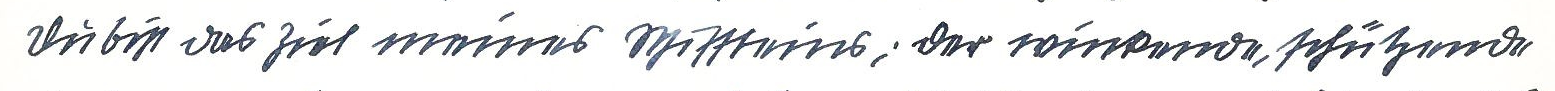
Du bist das Ziel meines Schiffleins; der winkende, schützende
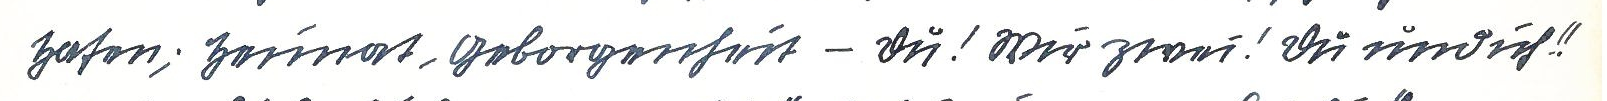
Hafen; Heimat, Geborgenheit – Du! Wir zwei! Du und Ich!!
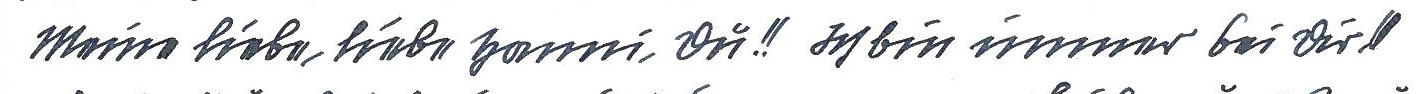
Meine liebe, liebe, Du!! Ich bin immer bei Dir!!
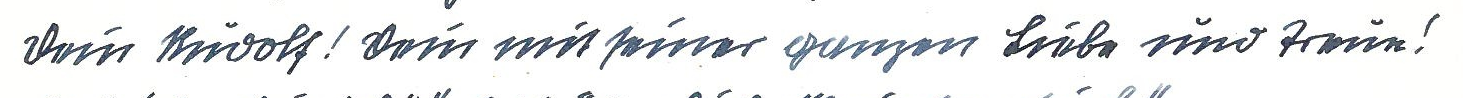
Dein ! Dein mit seiner ganzen Liebe und Treue!
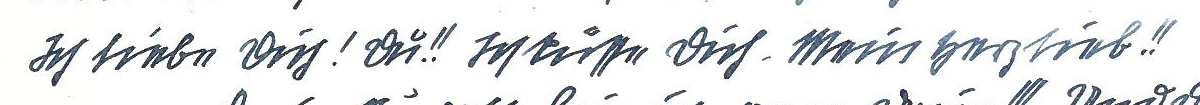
Ich liebe Dich! Du!! Ich küsse Dich. Mein Herzlieb!!
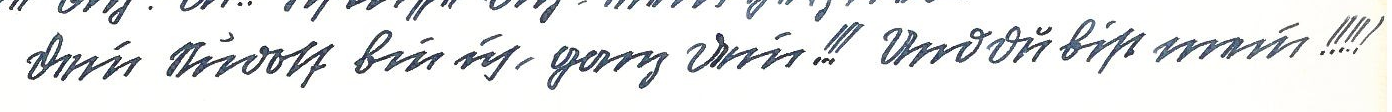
Dein bin ich, ganz Dein!!! Und Du bist mein!!!!!
